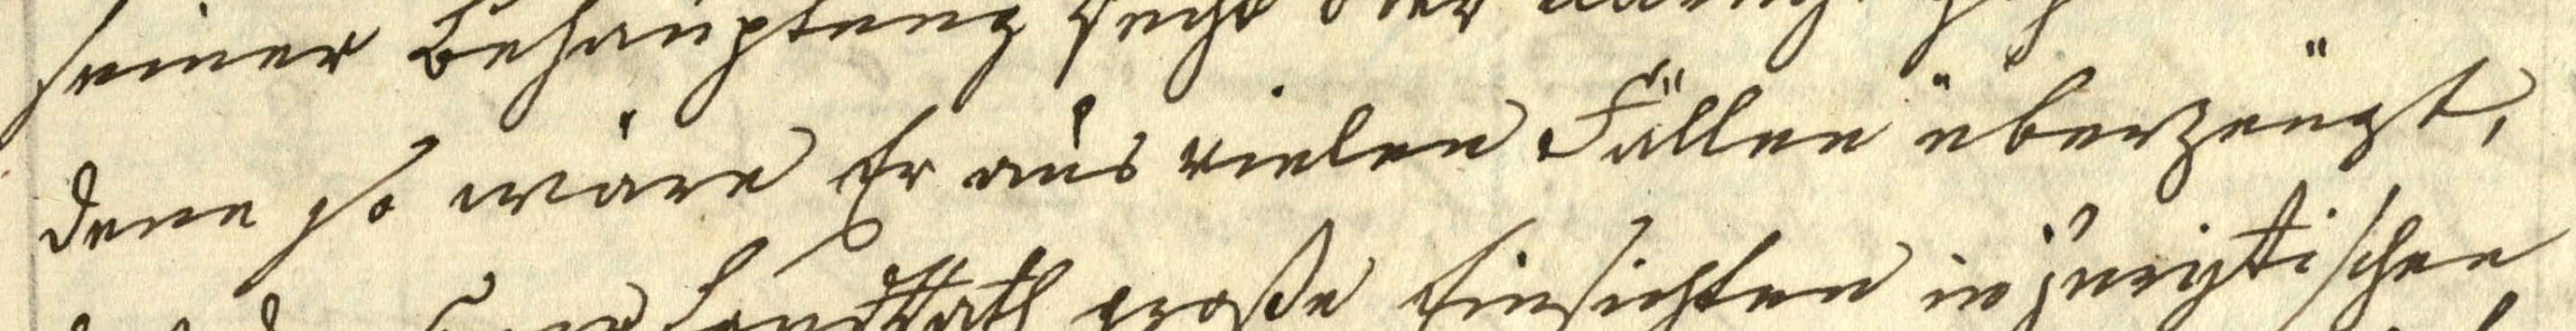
denn so wäre Er aus vielen Fällen überzeugt,
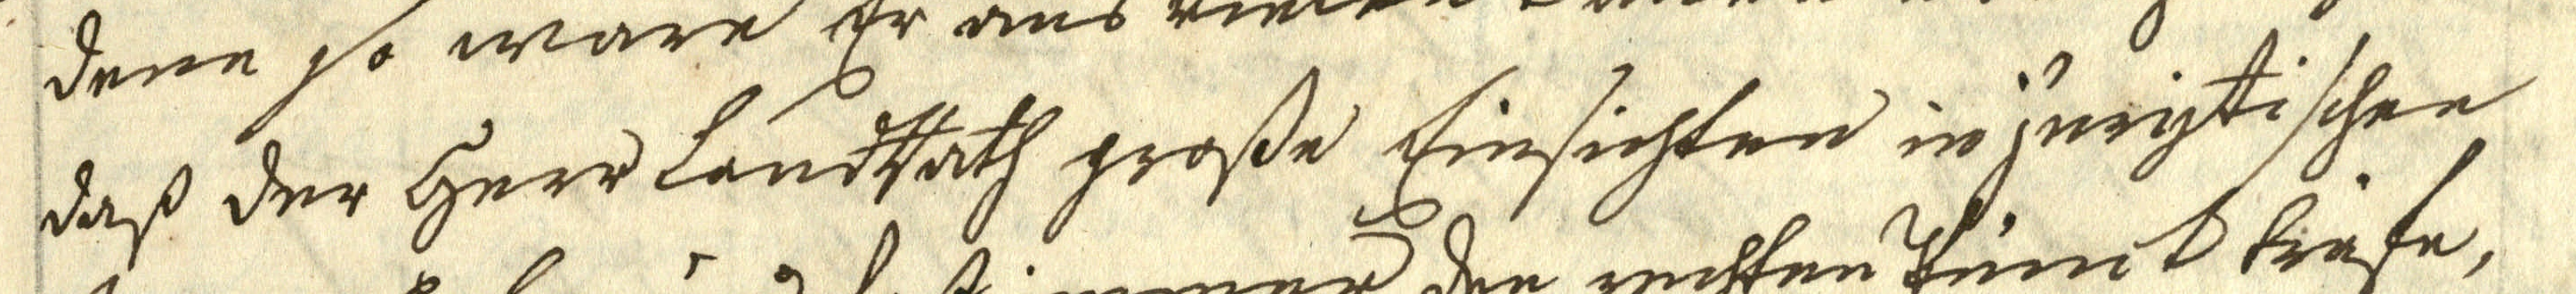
daß der Herr LandRath große Einsichten in juristischen
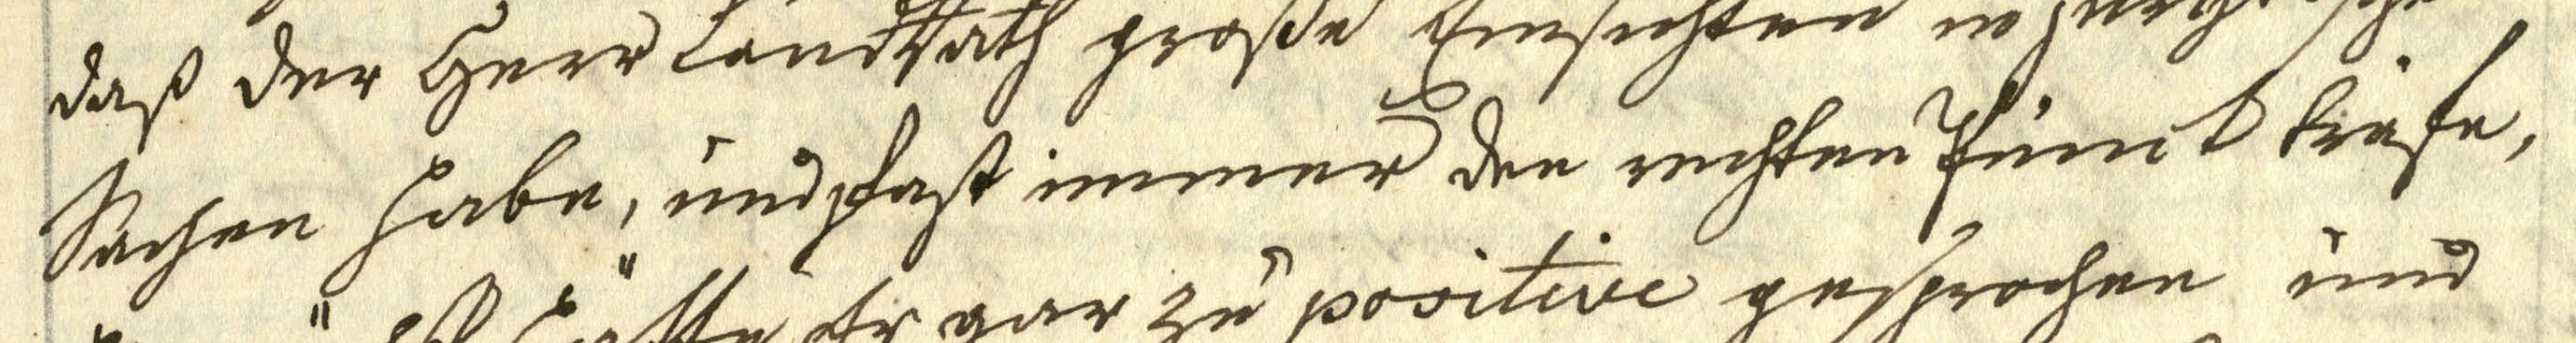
Sachen habe, und fast immer den rechten Punct träfe,
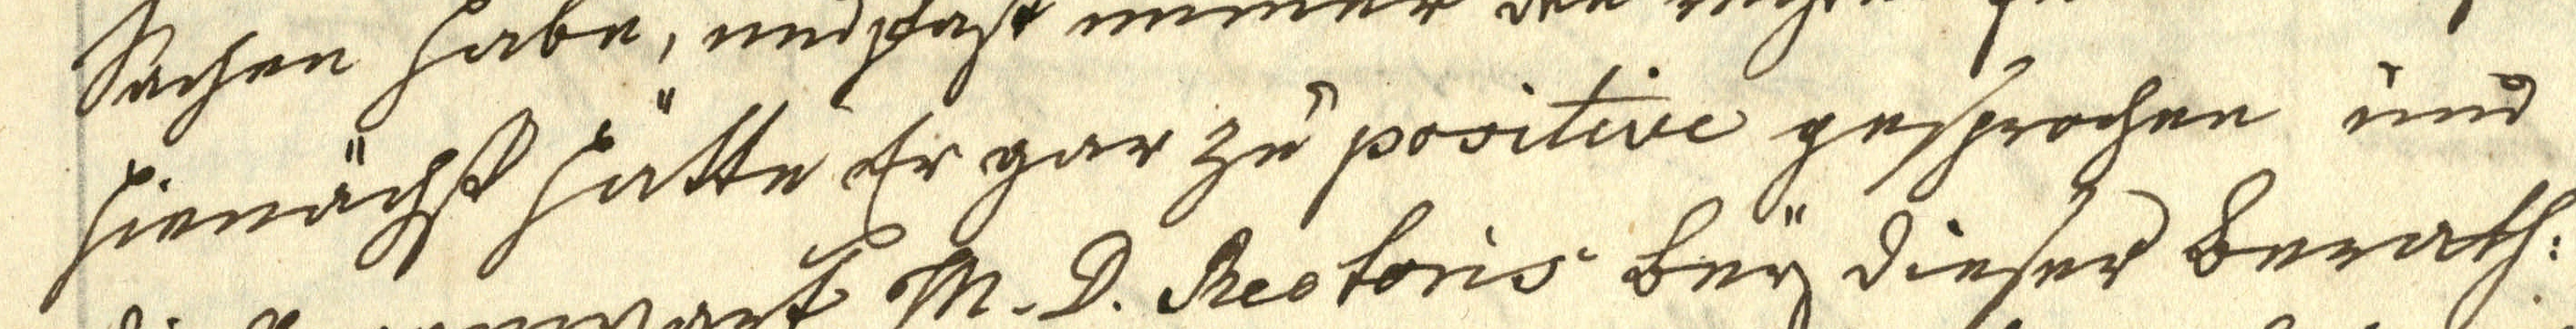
hienächst hätte Er gar zu positive gesprochen und
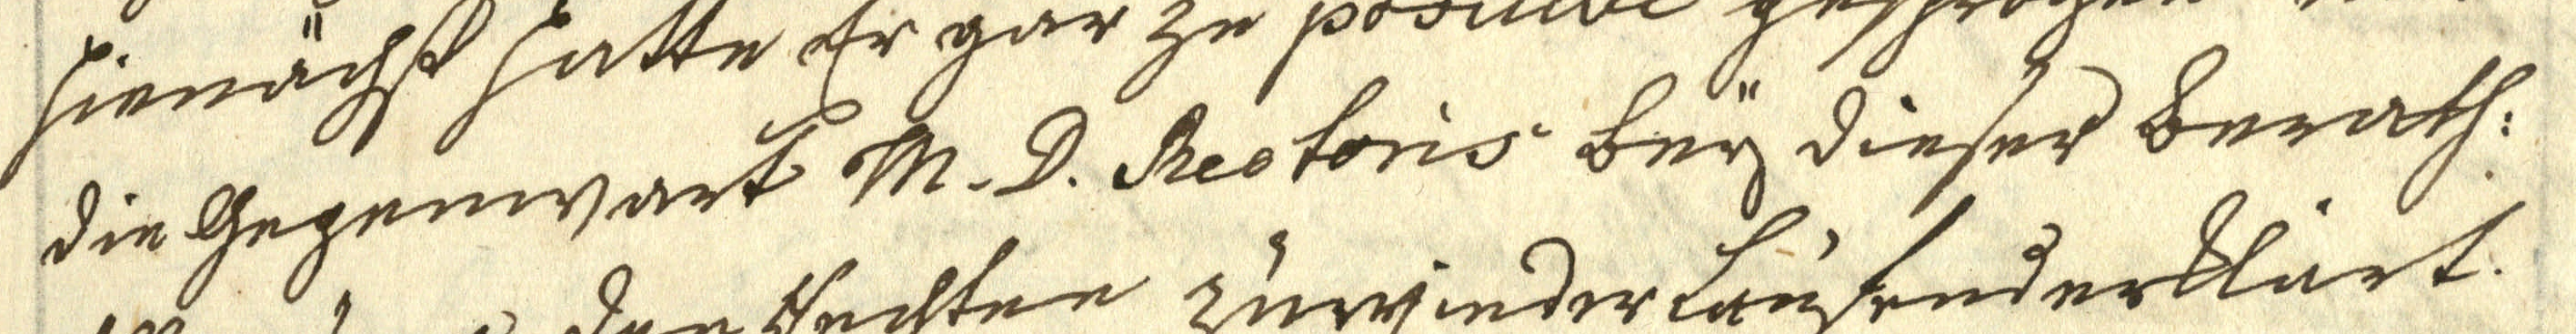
die Gegenwart M. M. Rectoris beÿ dieser Berath¬
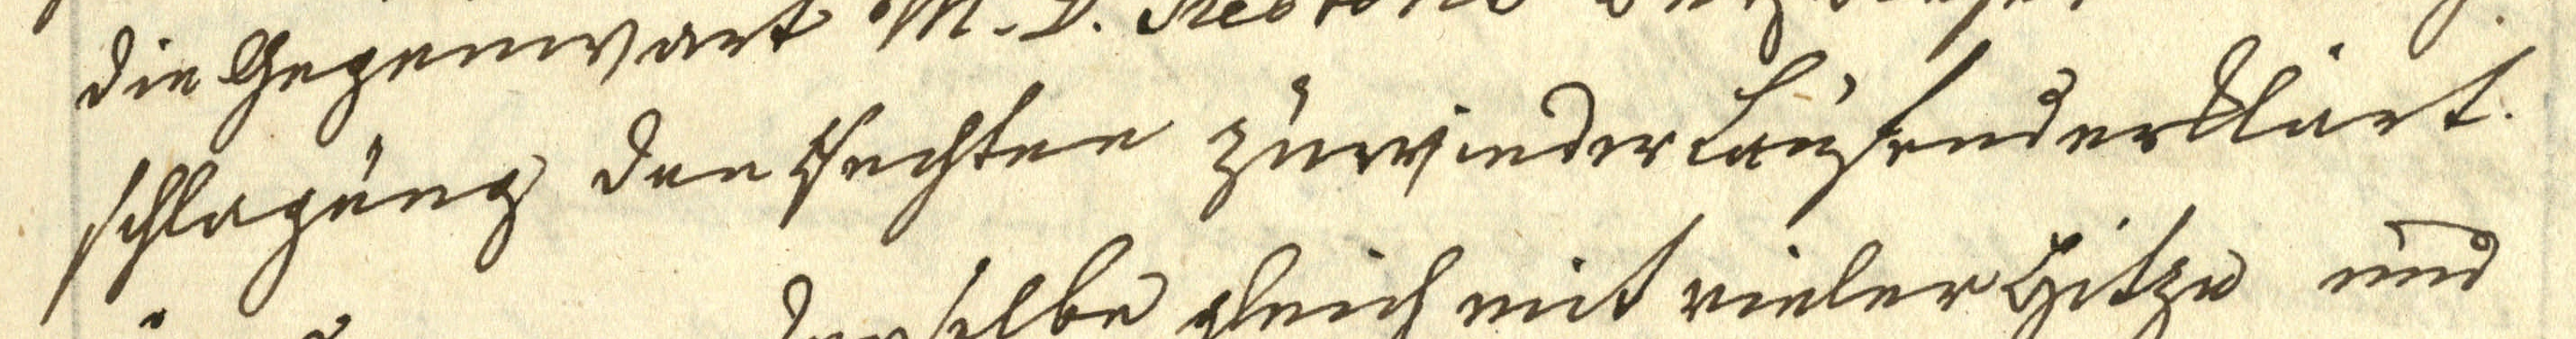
schlagung den Rechten zuwieder laufend erklärt.
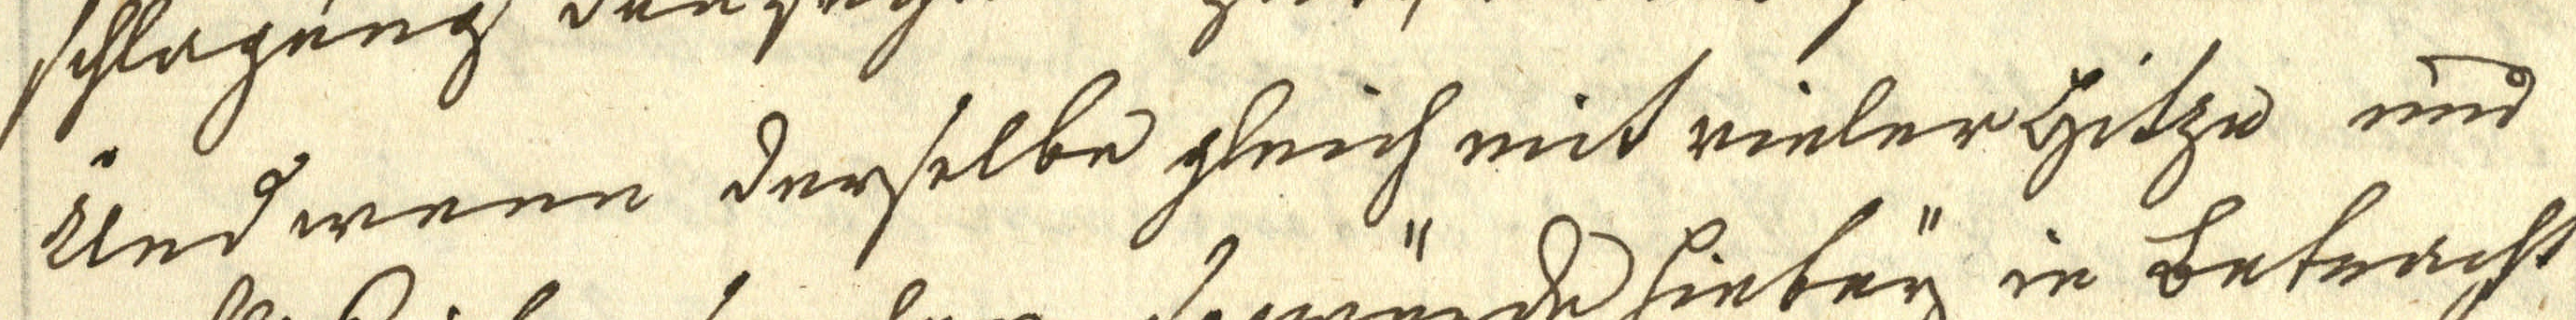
Und wenn derselbe gleich mit vieler Hitze und
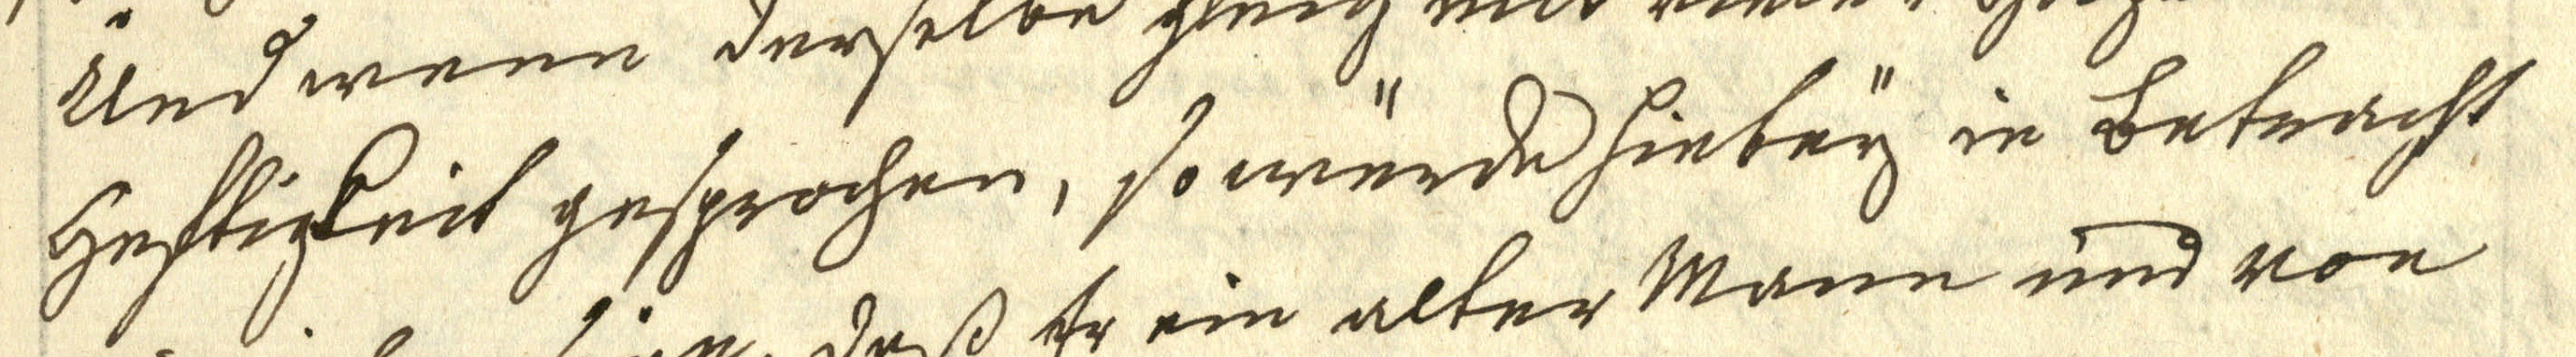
Heftigkeit gesprochen, so würde hiebeÿ in Betracht
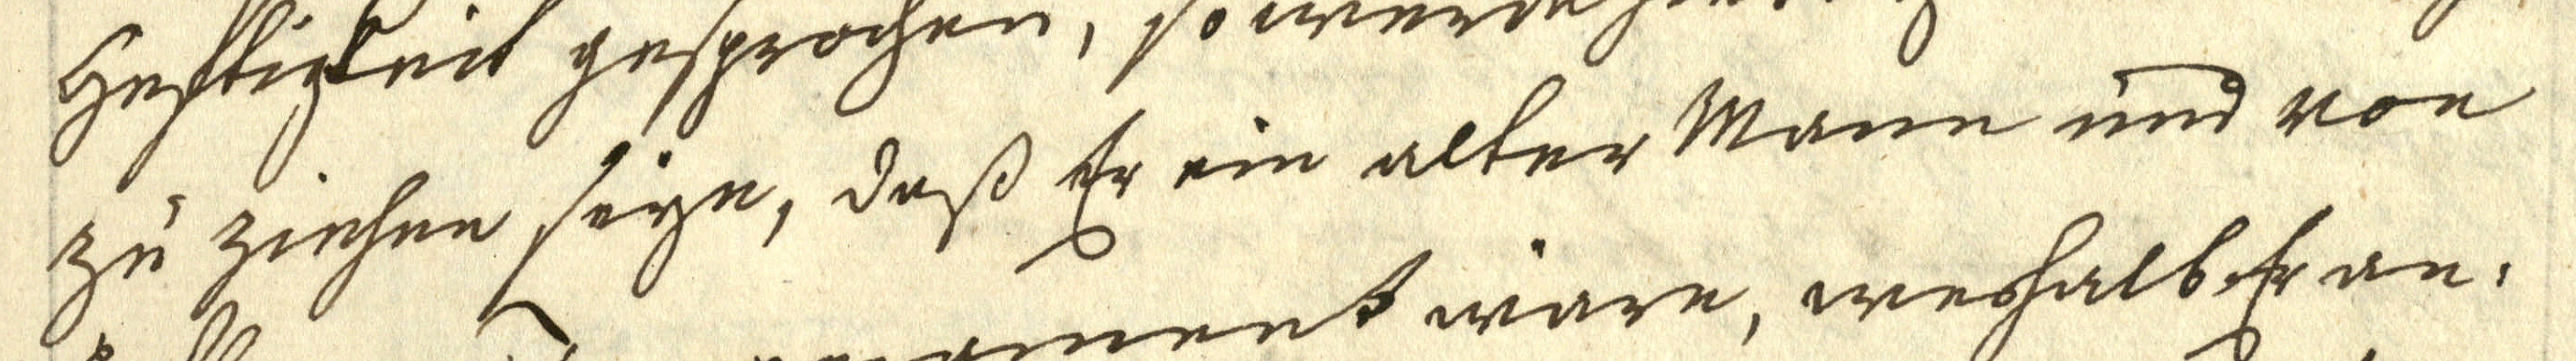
zu ziehen seÿn, daß Er ein alter Mann und von
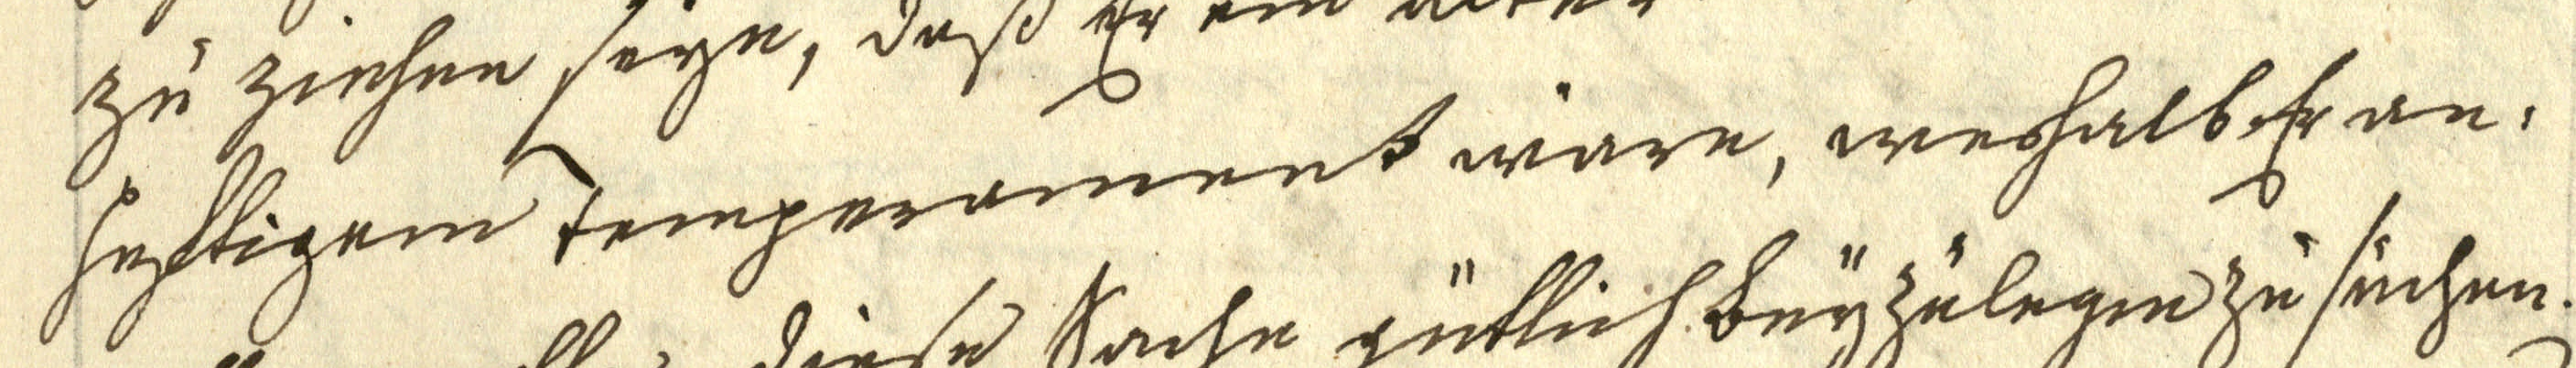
heftigem Temperament wäre, weshalb Er an¬
